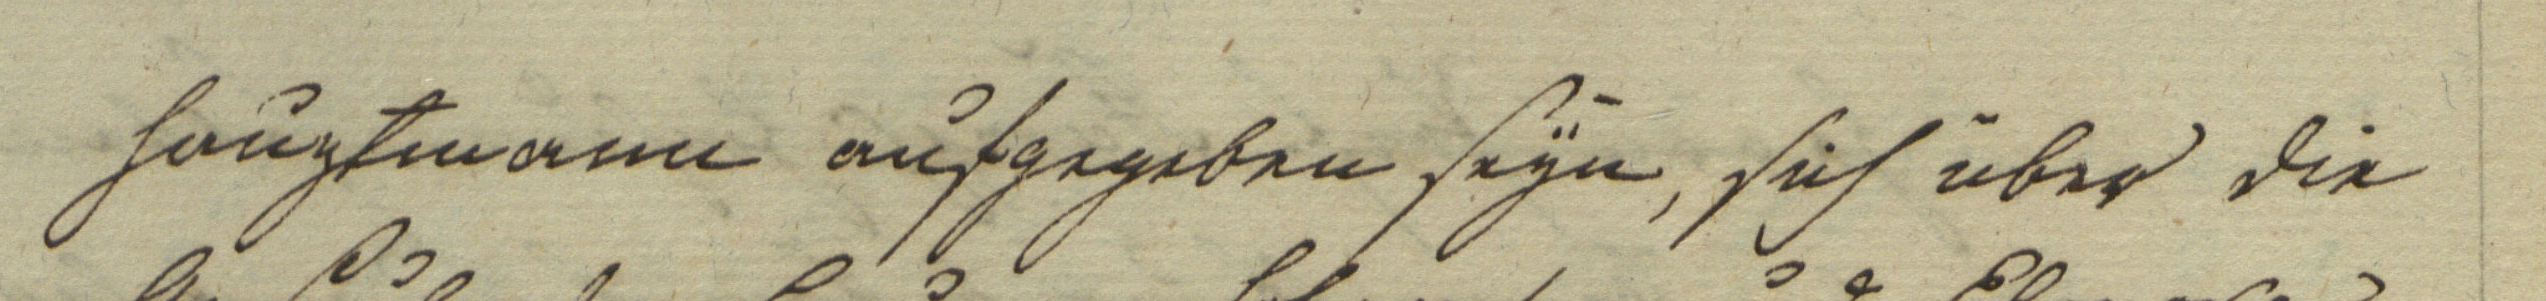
hauptmann aufgegeben seÿn, sich über die
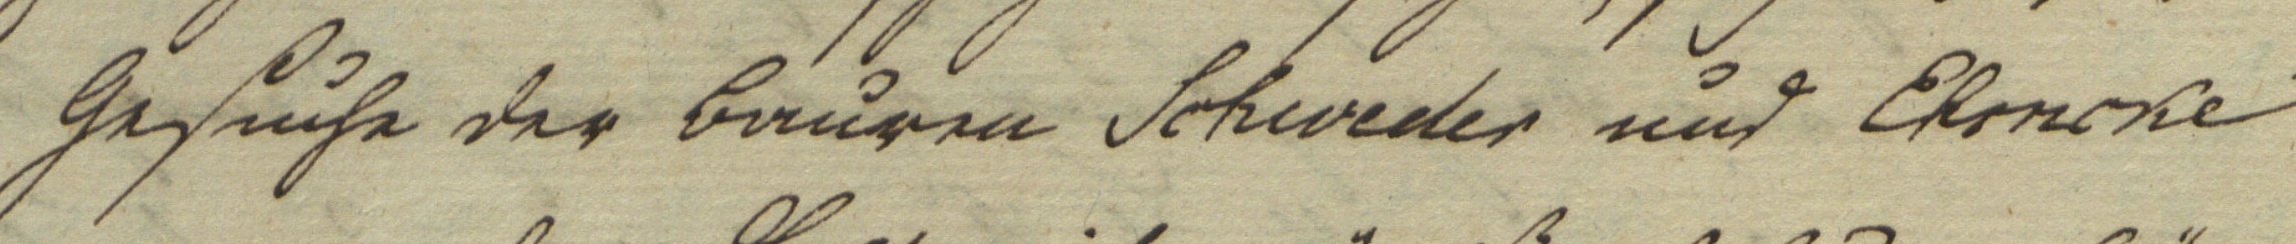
Gesuche der Bauren Schweder und Ehmcke
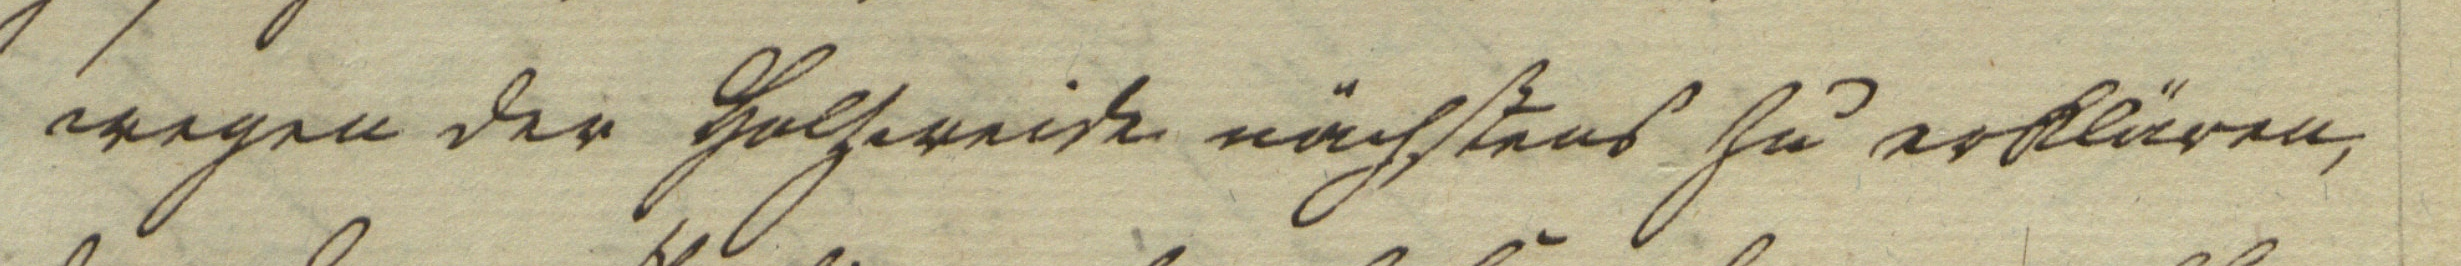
wegen der Holzweide nächstens zu erklären,
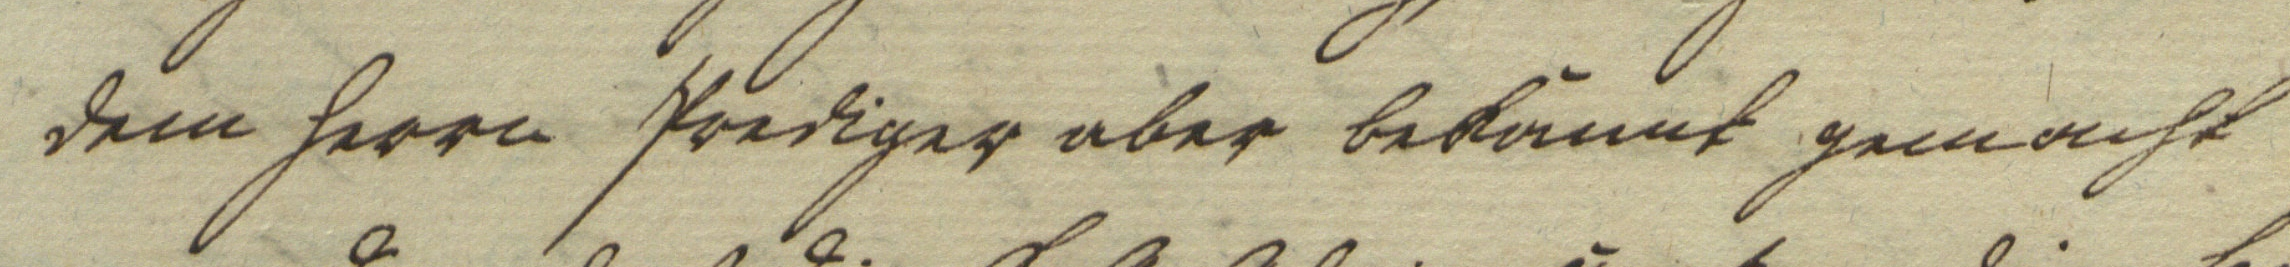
dem Herrn Prediger aber bekannt gemacht
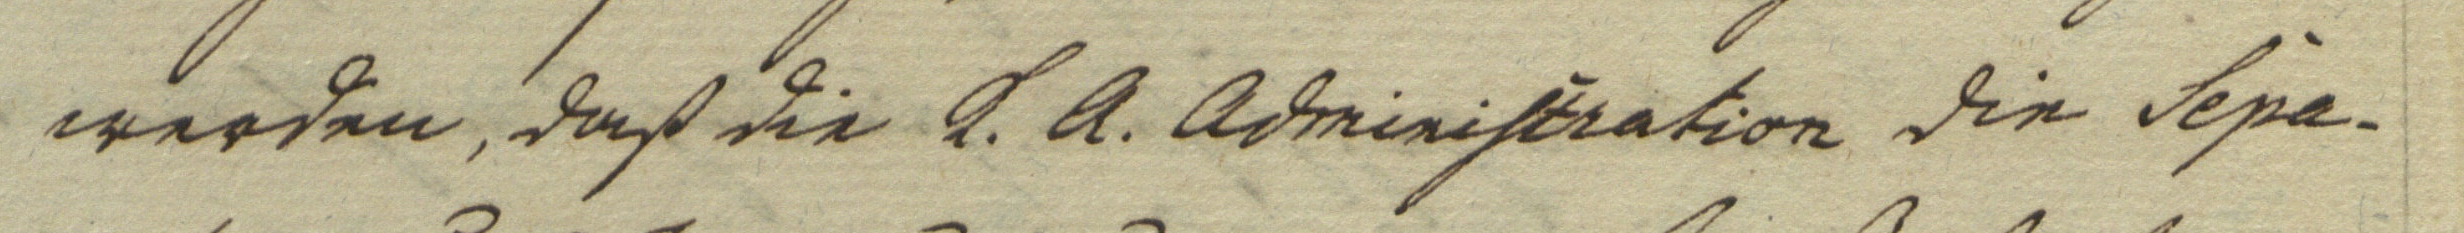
werden, daß die K. A. Administration die Sepa¬
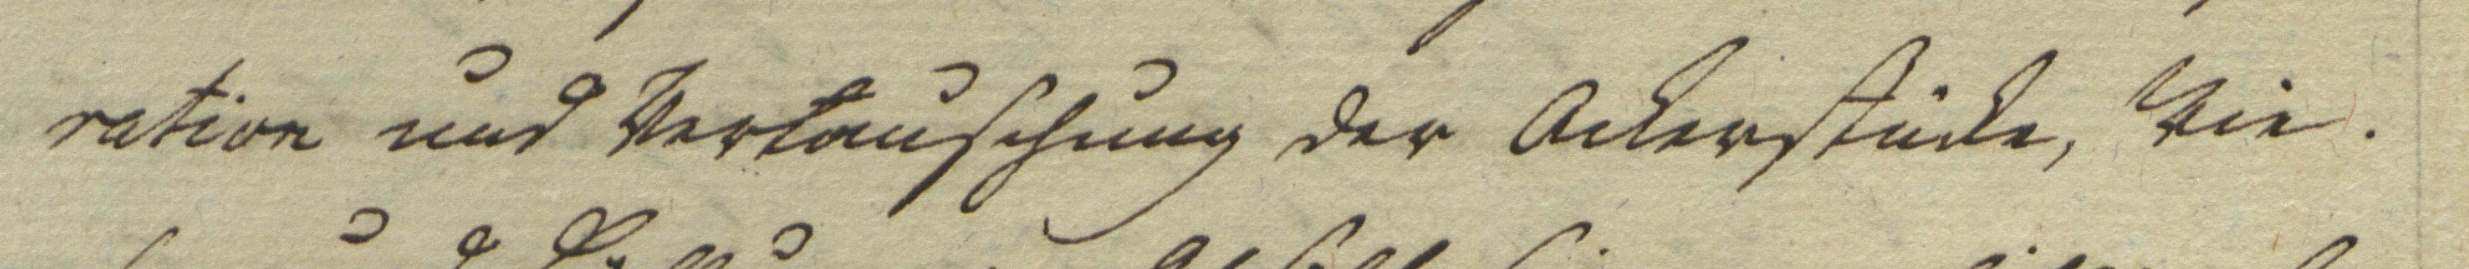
ration und Vertauschung der Ackerstücke, Wie¬
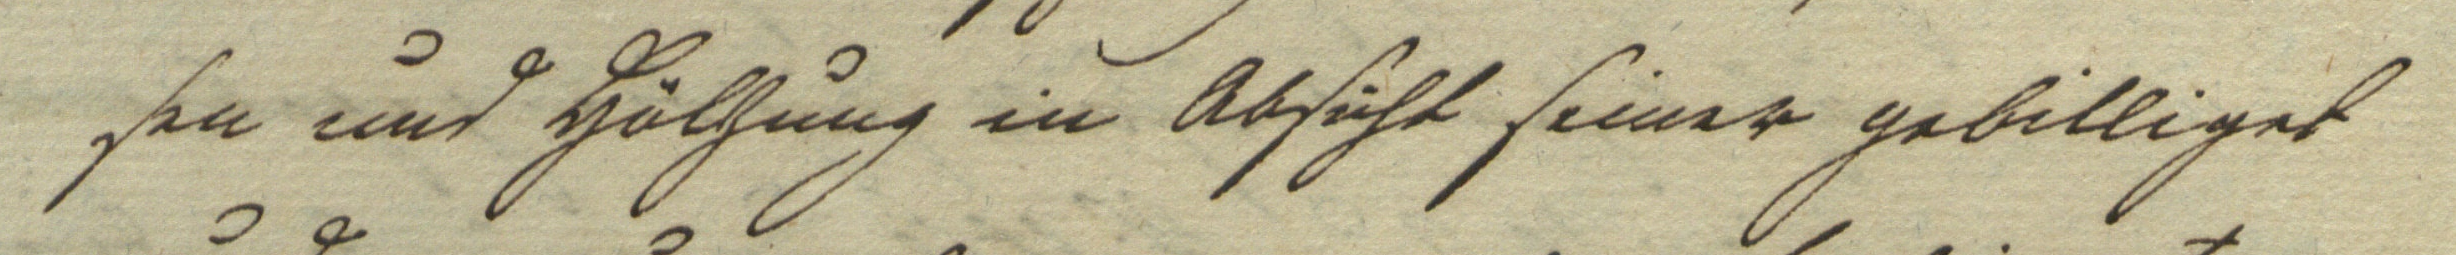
sen und Hölzung in Absicht seiner gebilliget
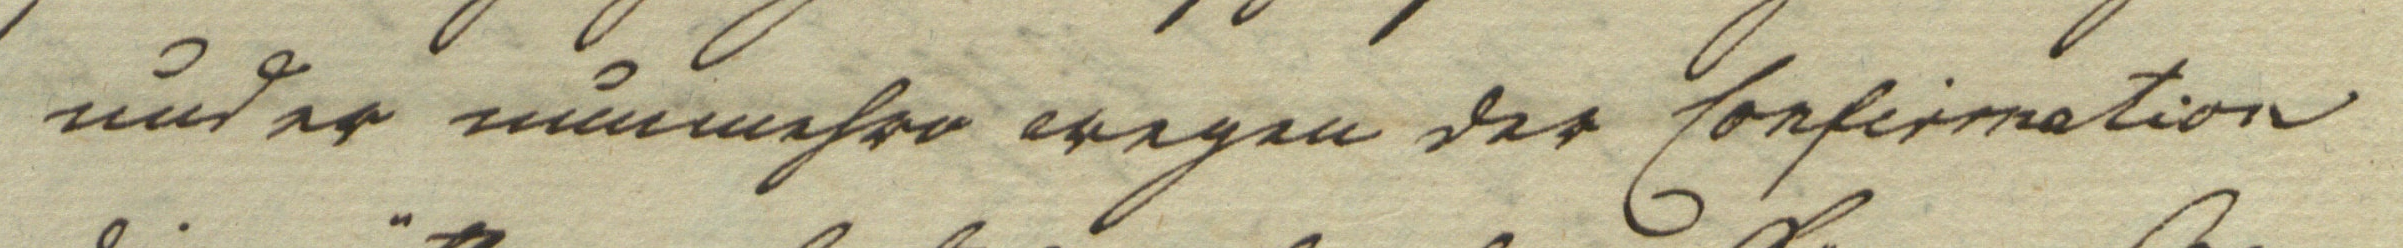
und er nunmehro wegen der Confirmation
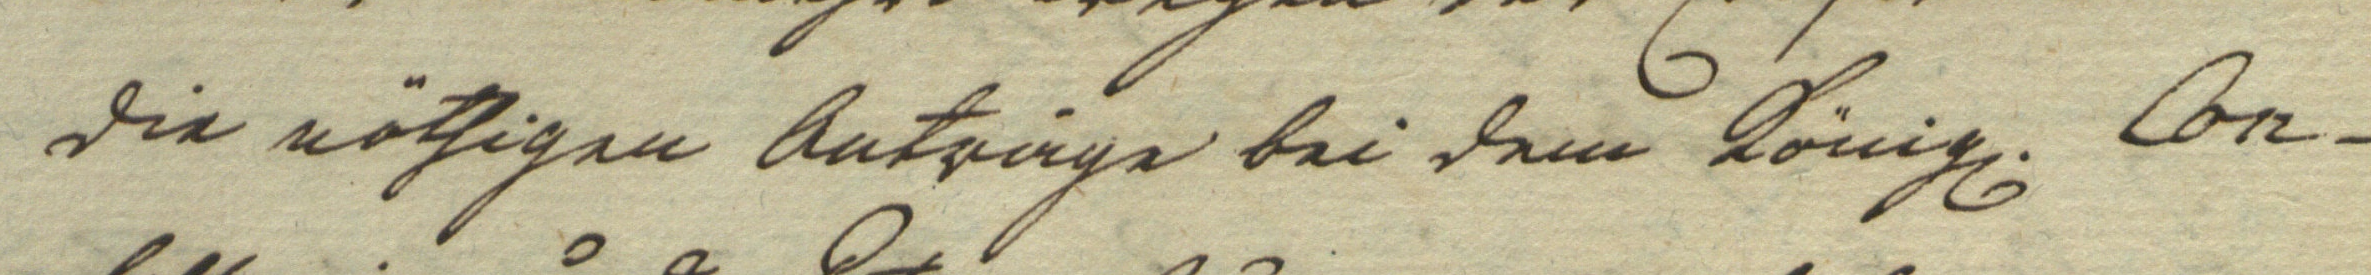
die nöthigen Anträge bei dem Königl. Con¬
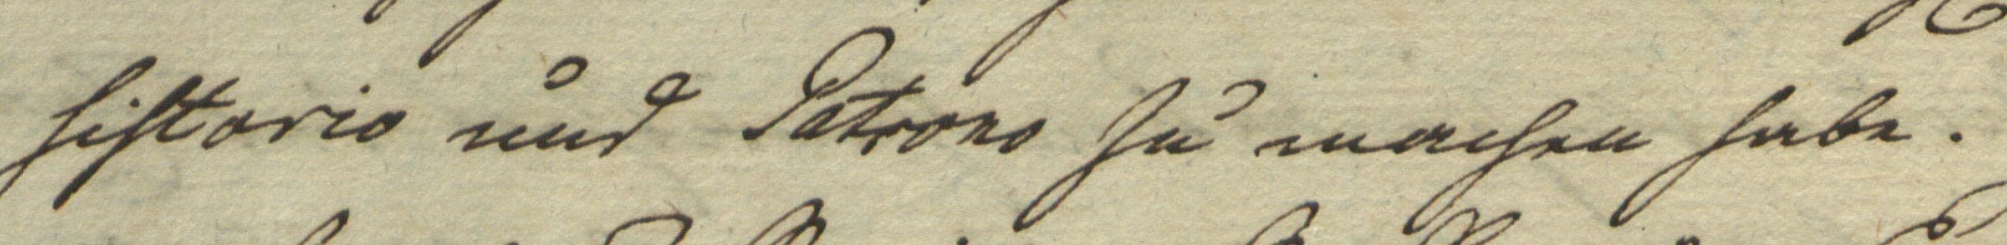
sistorio und Patrono zu machen habe.
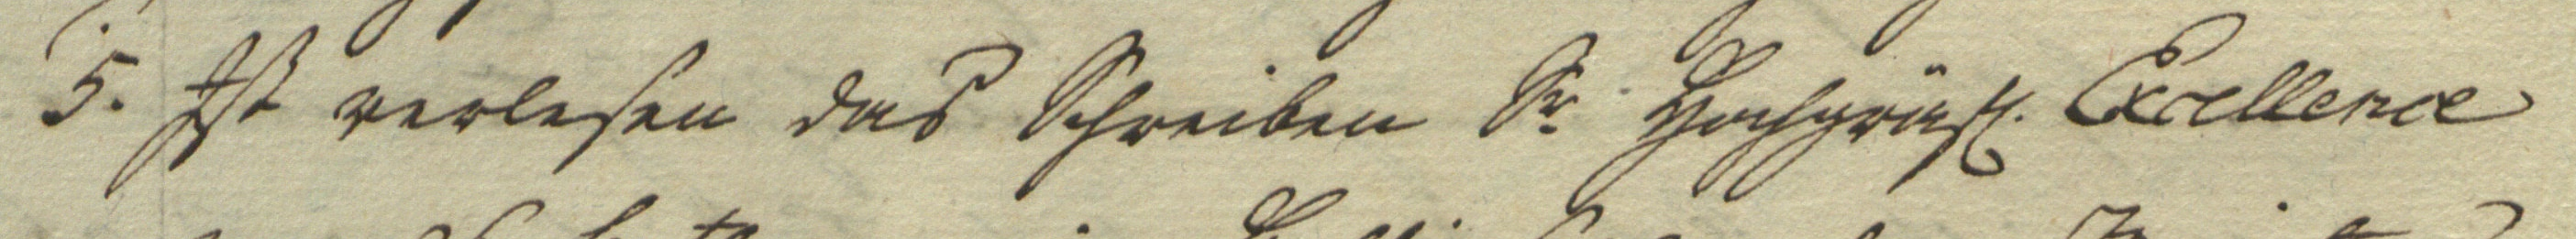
5. Ist verlesen das Schreiben Sr Hochgräfl. Excellence
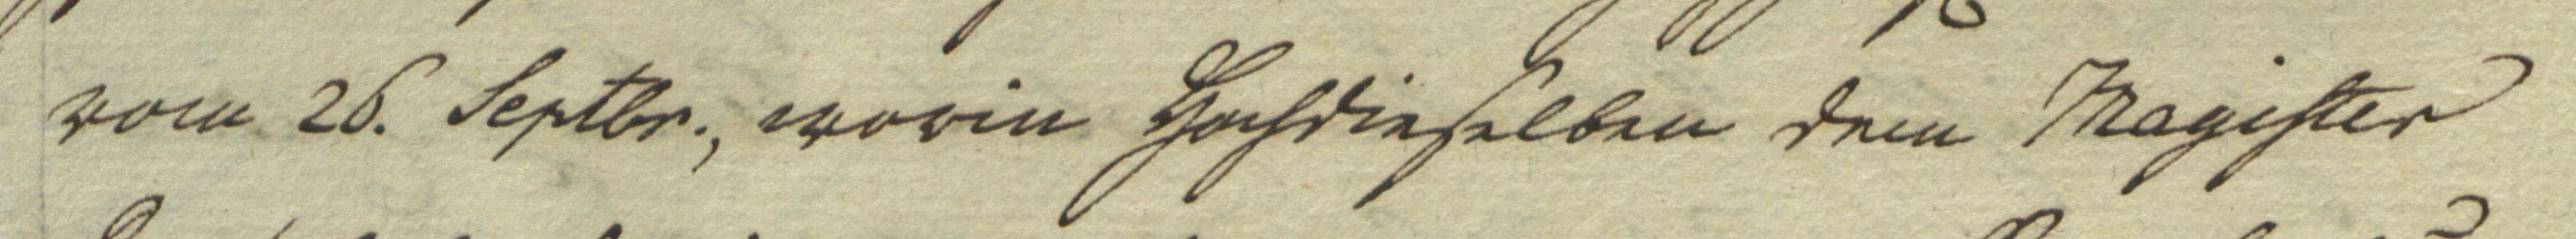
vom 26. Septbr., worin Hochdieselben dem Magister
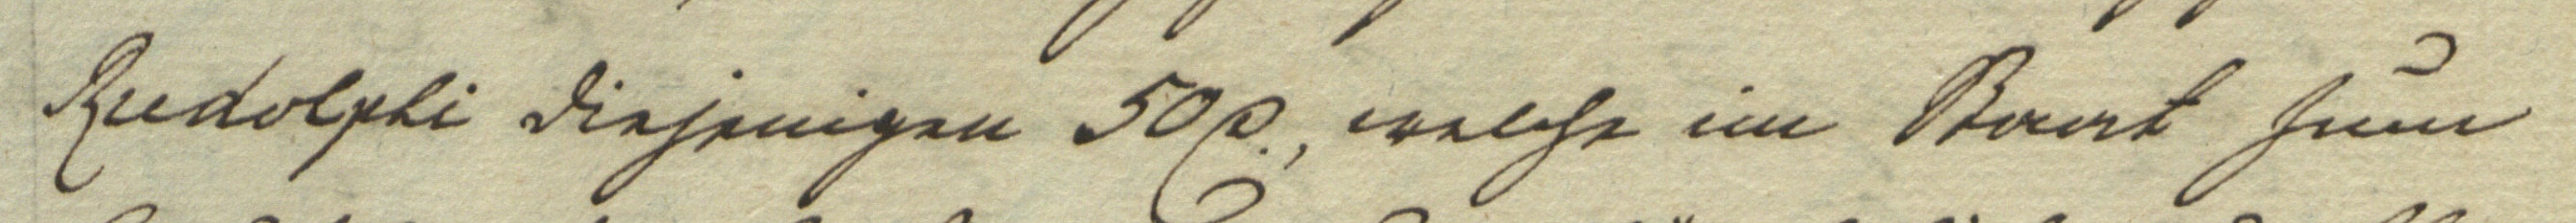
Rudolphi diejenigen 50 l. welche im Staat zum
